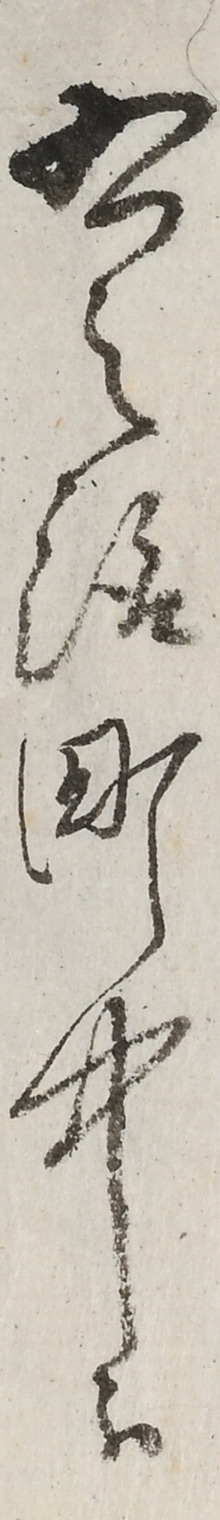右之趣町中え

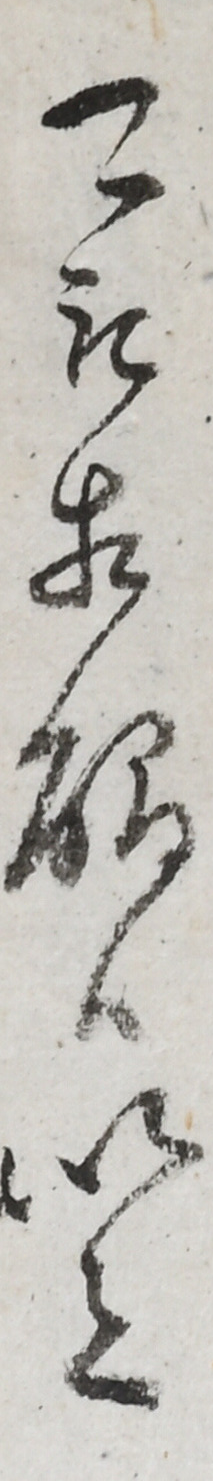可被相触候以上
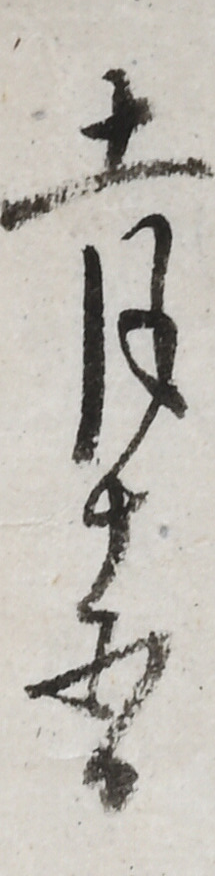十一月十五日
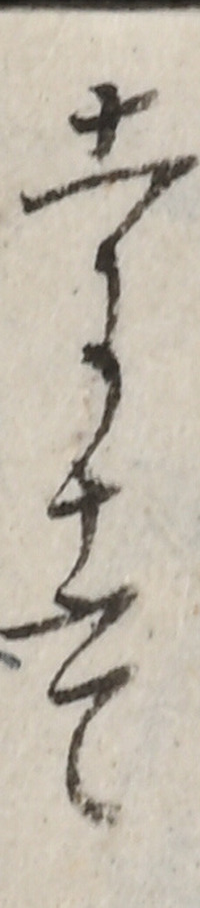十一月十五日

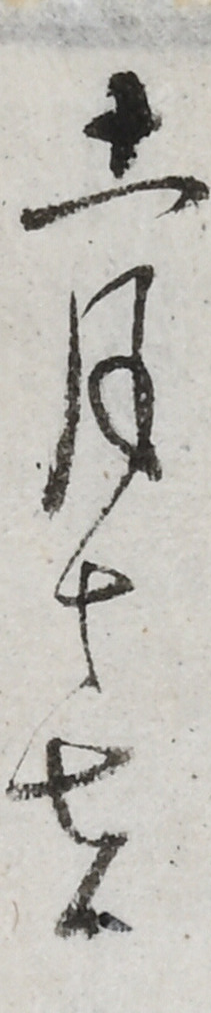十一月十七日
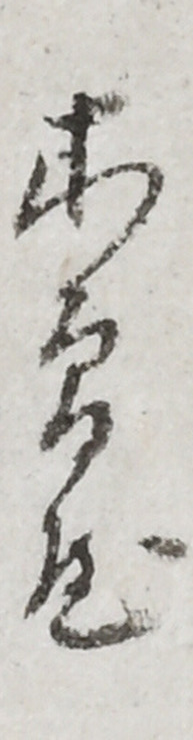木曽屋
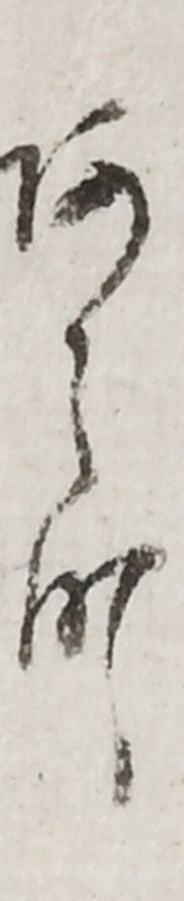あら町
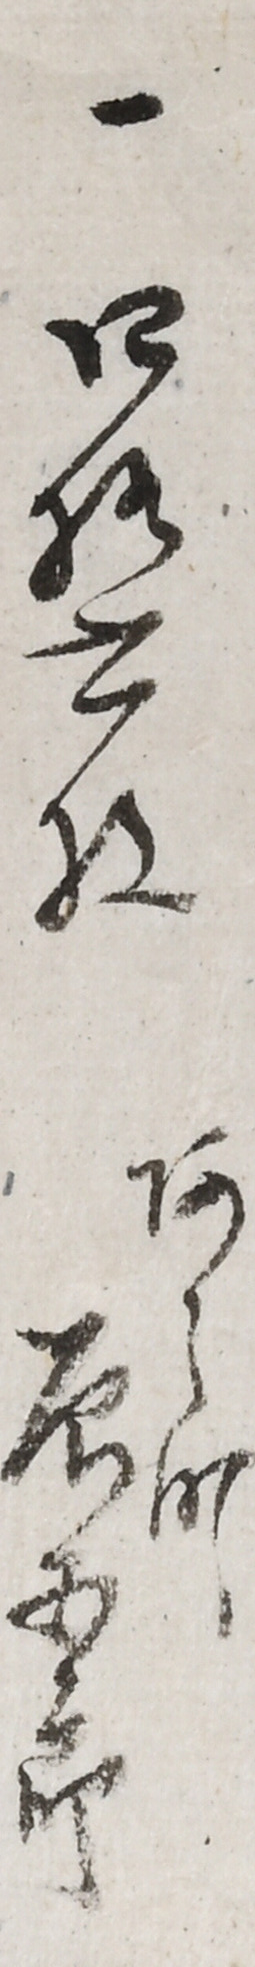一四拾六枚辰五郎
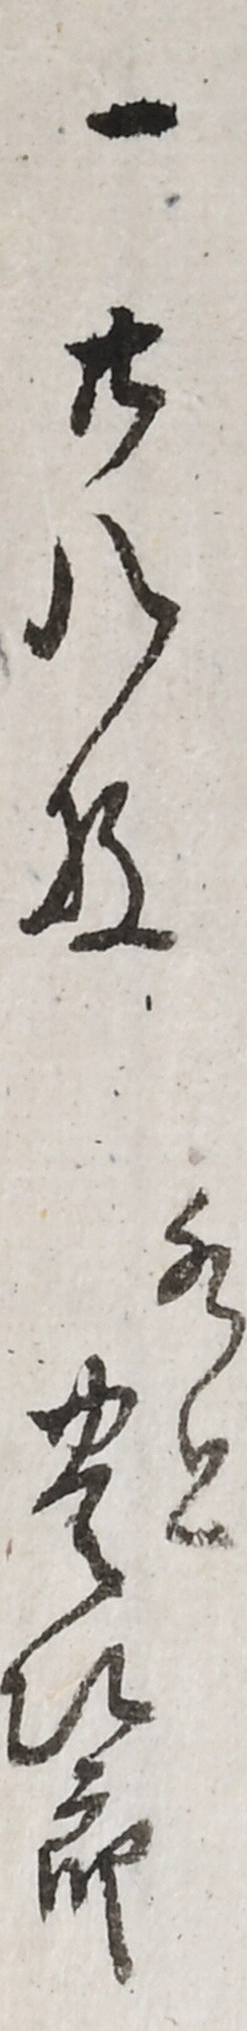一廿八枚豊次郎
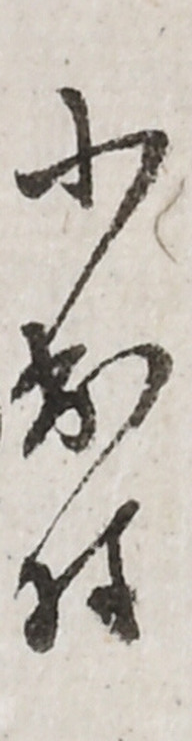小出村
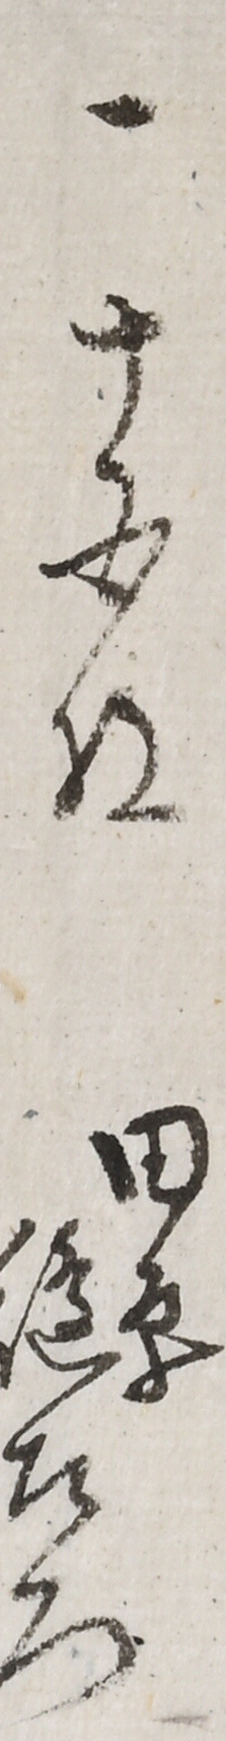一十五枚縫左衛門
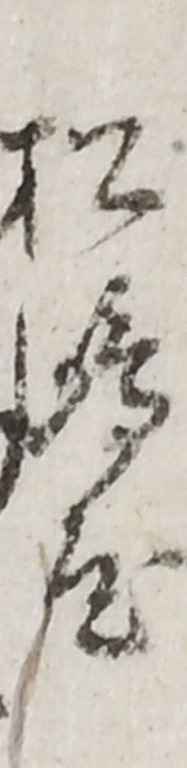松嶋屋
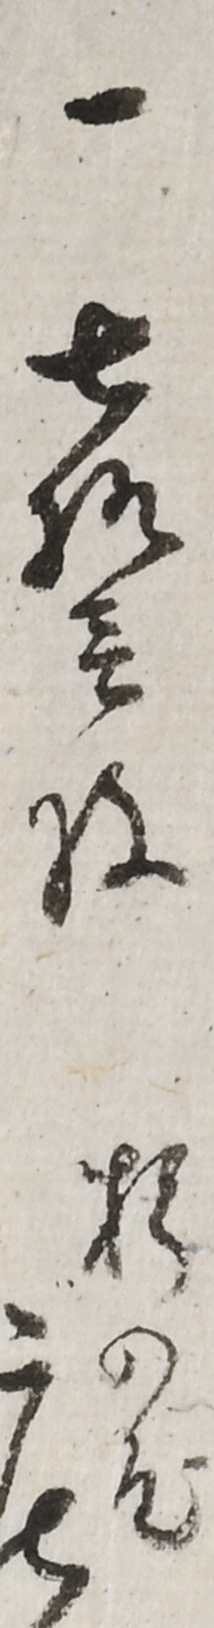一七拾壱枚庄七
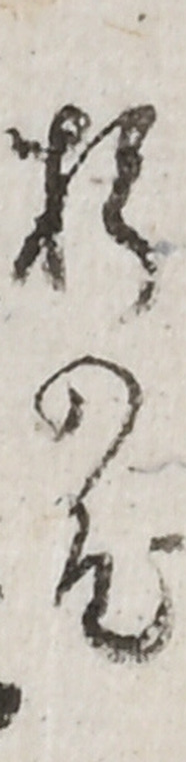杉の屋
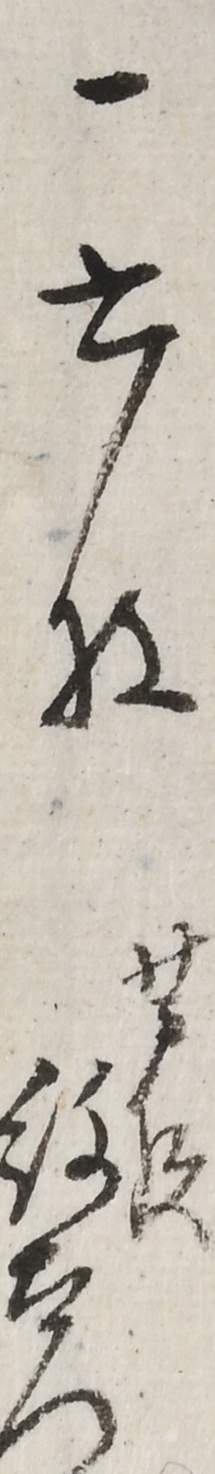一六枚紋右衛門
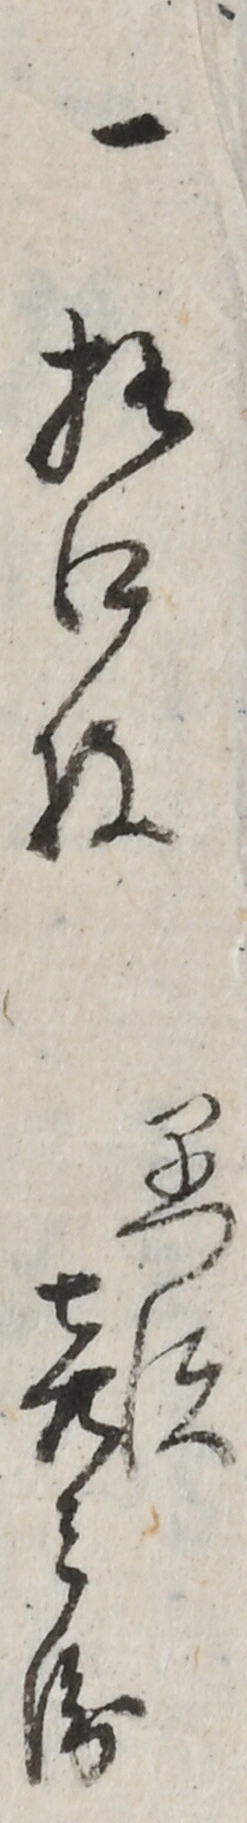一弐拾七枚長兵衛
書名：髙遠限楮幣引換覚帳
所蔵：伊那市立高遠町図書館・合同会社AMANE
